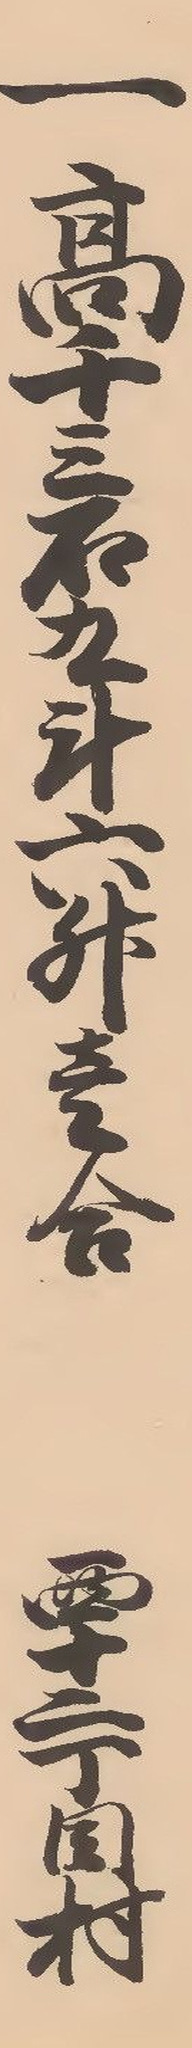一高千三石九斗六升壱合西十二丁目村
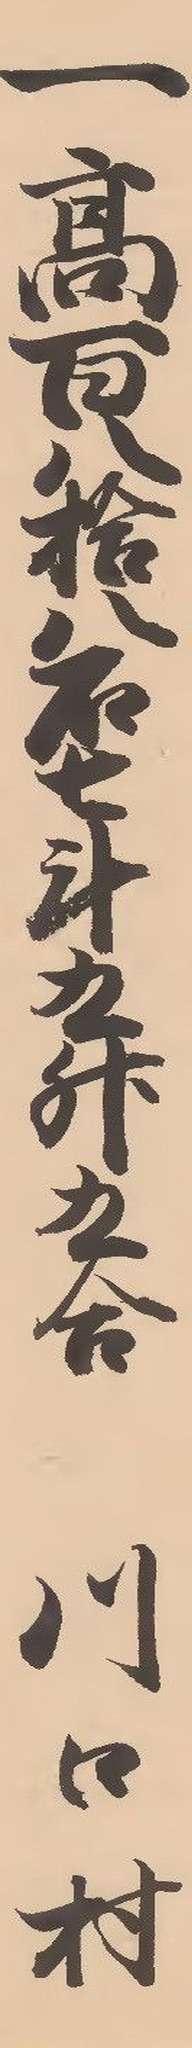一高百八拾八石七斗九升九合川口村
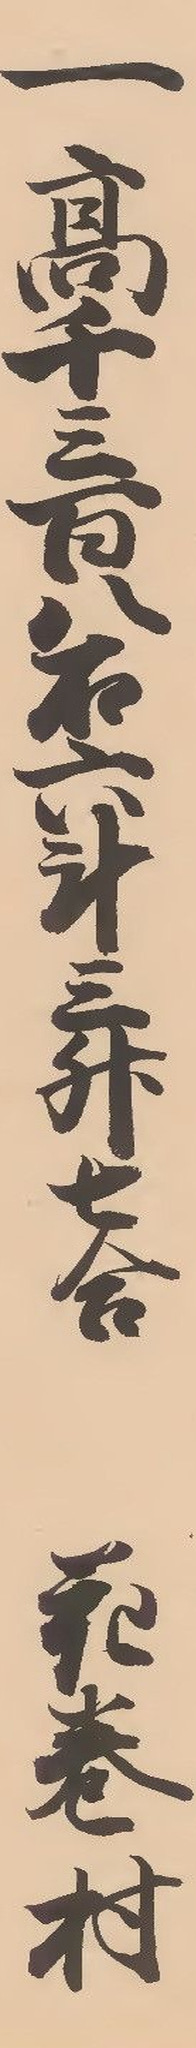一高千三百八石六斗三升七合花巻村
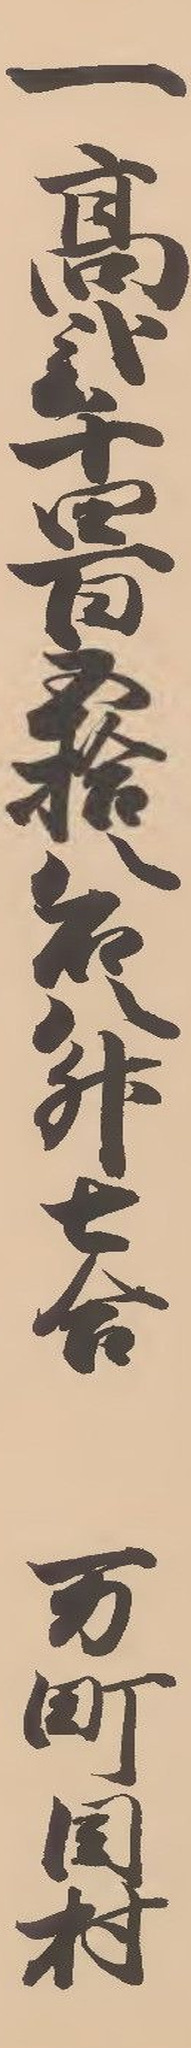一高弐千四百五拾八石八升七合万町目村
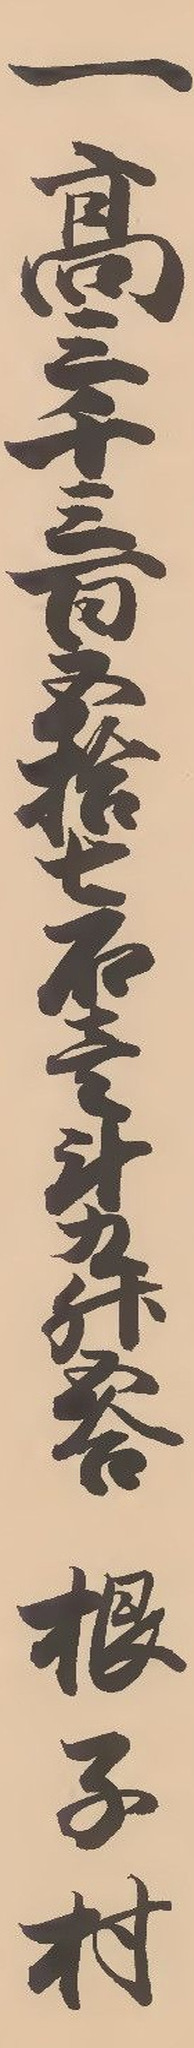一高三千三百五拾七石壱斗九升五合根子村
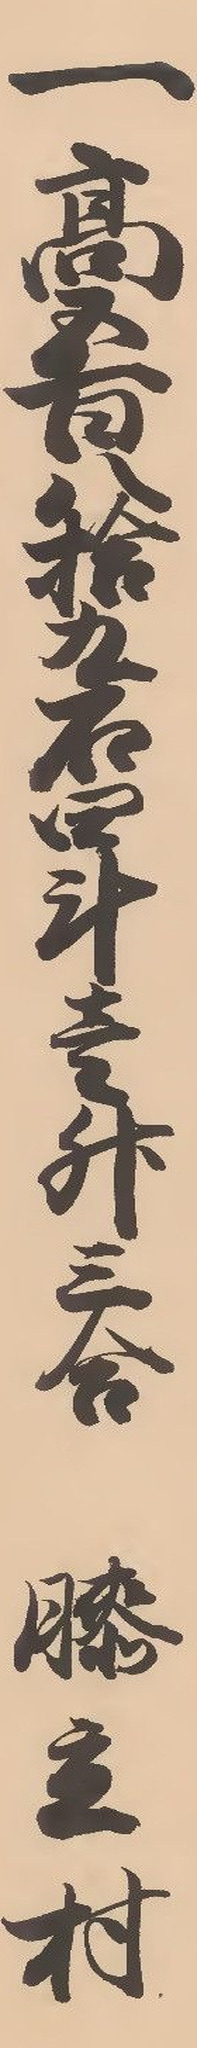一高五百八拾九石四斗壱升三合膝立村
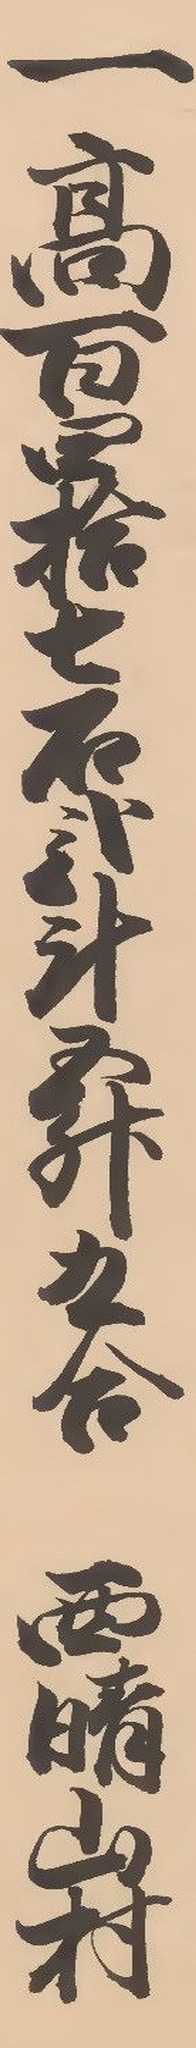一高百四拾七石弐斗五升九合西晴山村

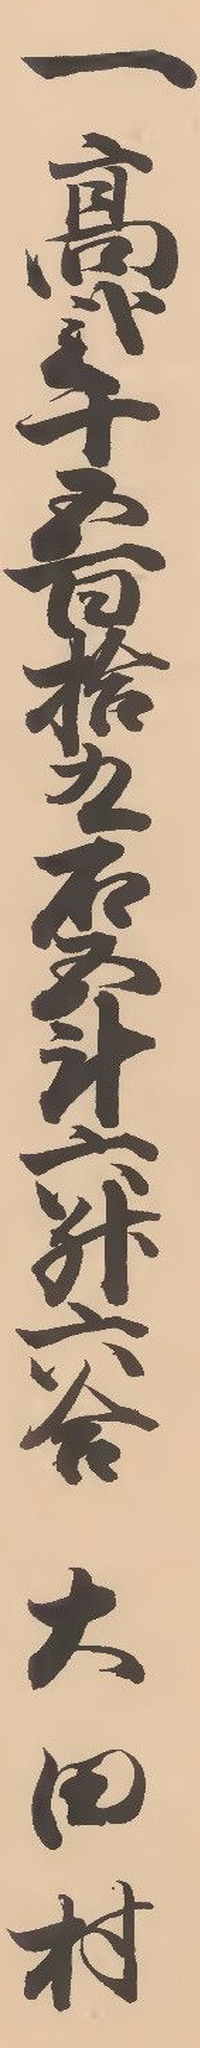一高弐千五百拾九石五斗六升六合大田村
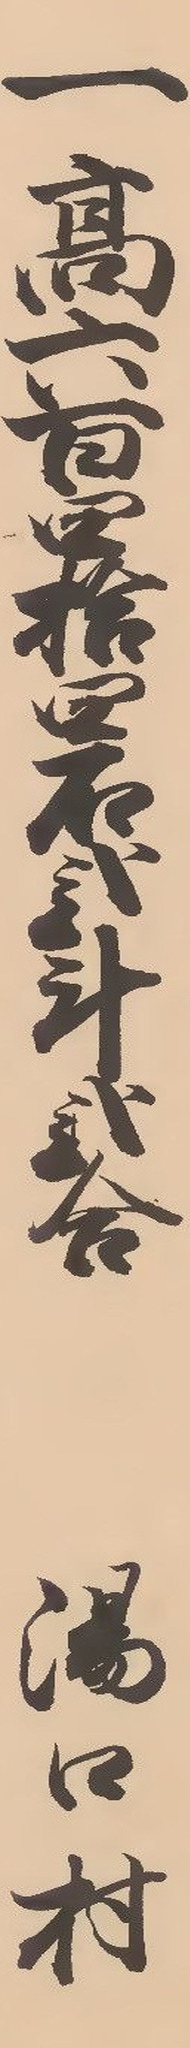一高六百四拾四石弐斗弐合湯口村
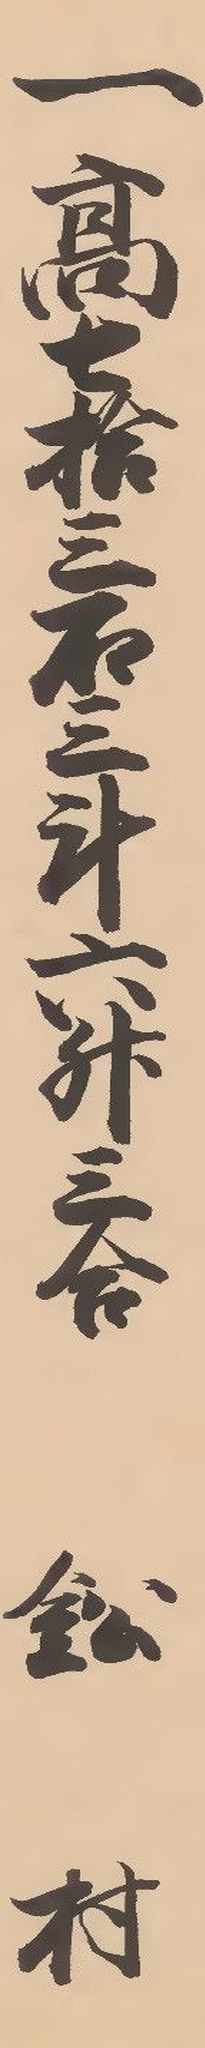一高七拾三石三斗六升三合鉛村
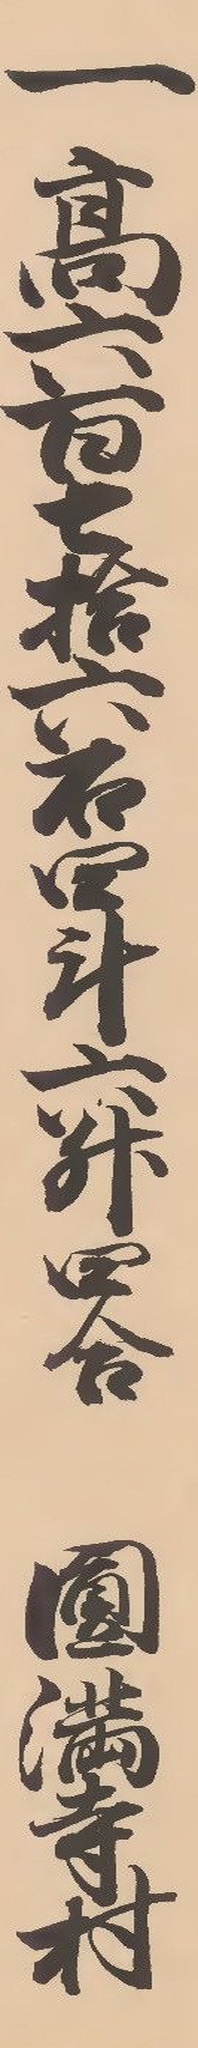一高六百七拾六名四斗六升四合円満寺村
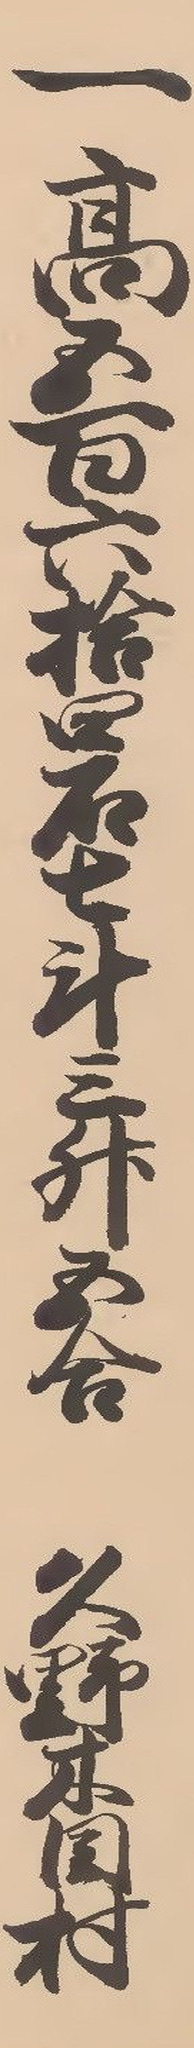一高五百六拾四石七斗三升五合久野木目村
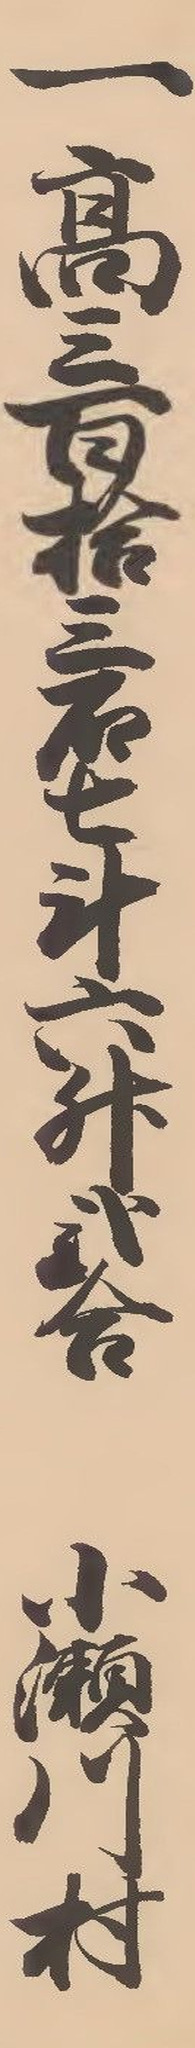一高三百拾三石七斗六升弐合小瀬川村
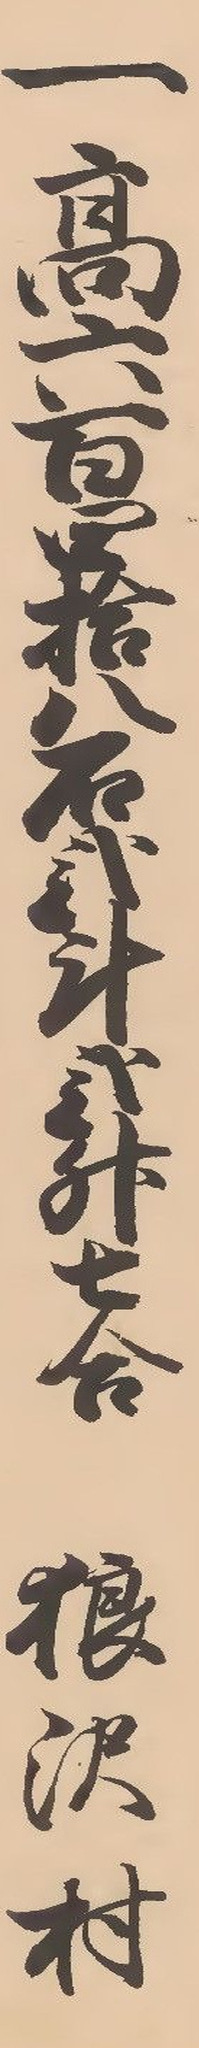一高六百四拾八石弐斗弐升七合狼沢村
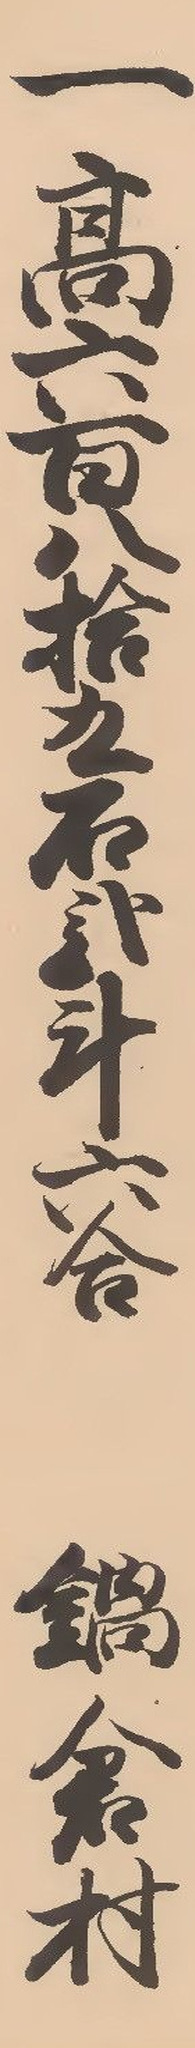一高六百八拾九石弐斗六合鍋倉村

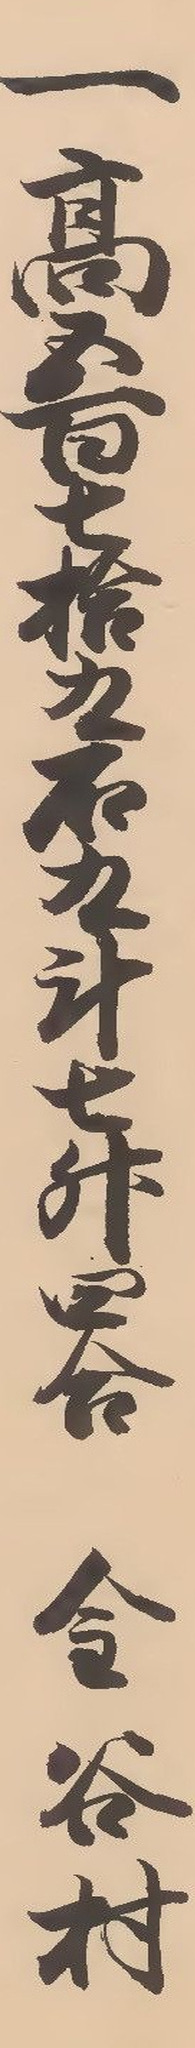一高五百七拾九石九斗七升四合金谷村
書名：陸奥国郷帳　６
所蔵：国立公文書館 National Archives of Japan
